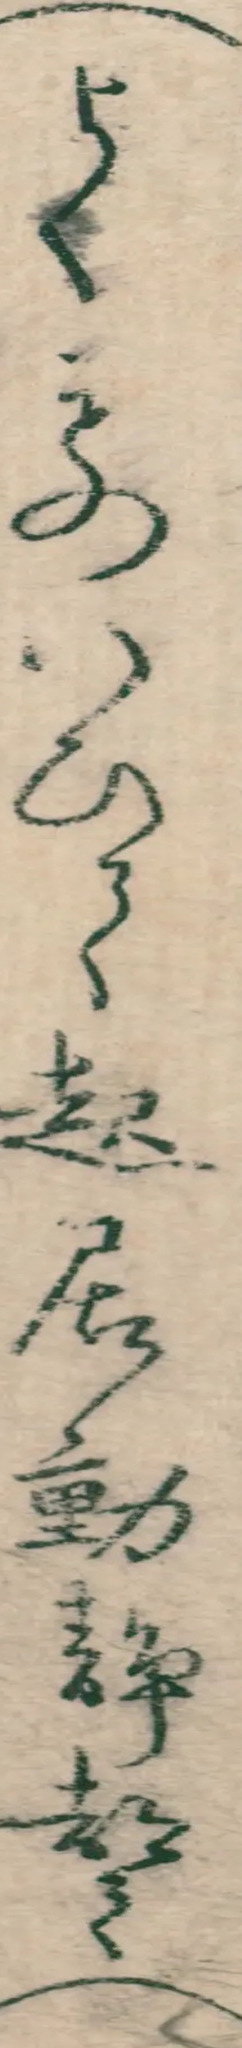よくもの言ひて起居動静都て
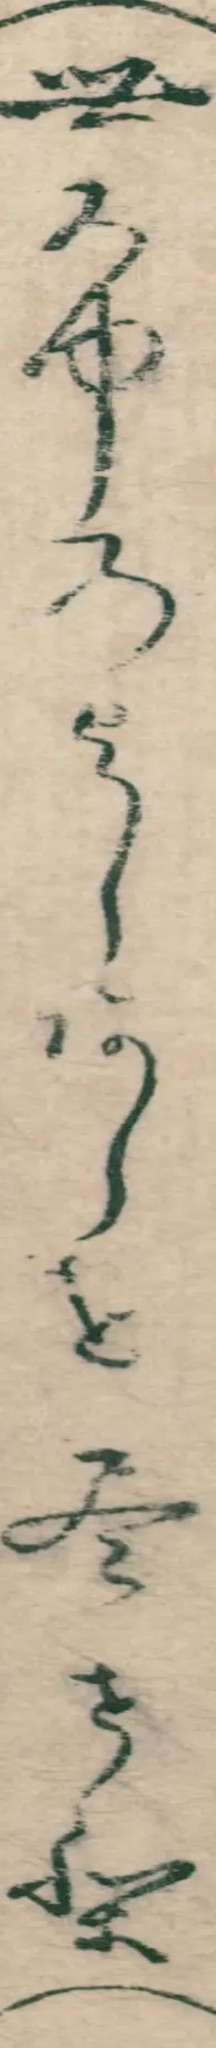世の中のよしあしを尽せり
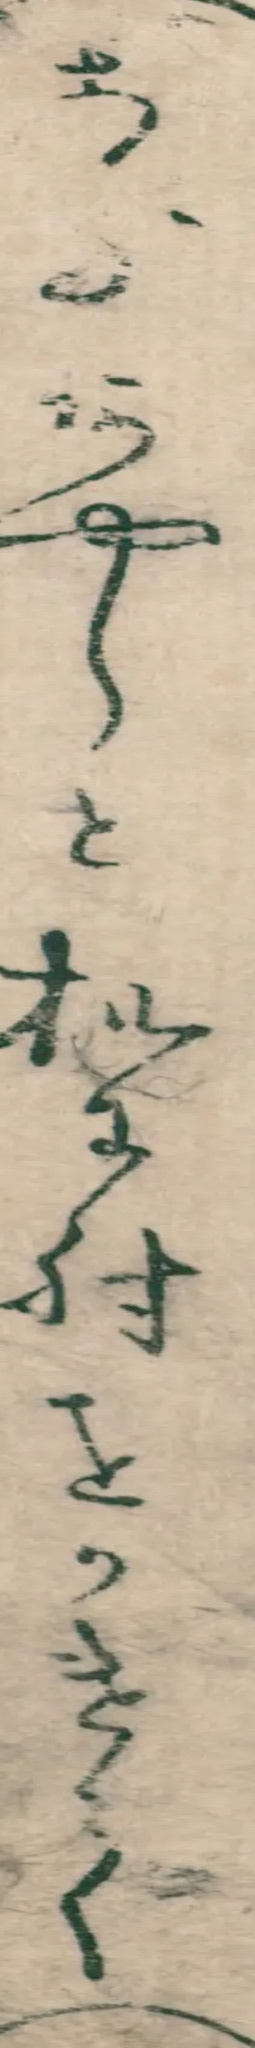あなあやしと机に肘をかけて
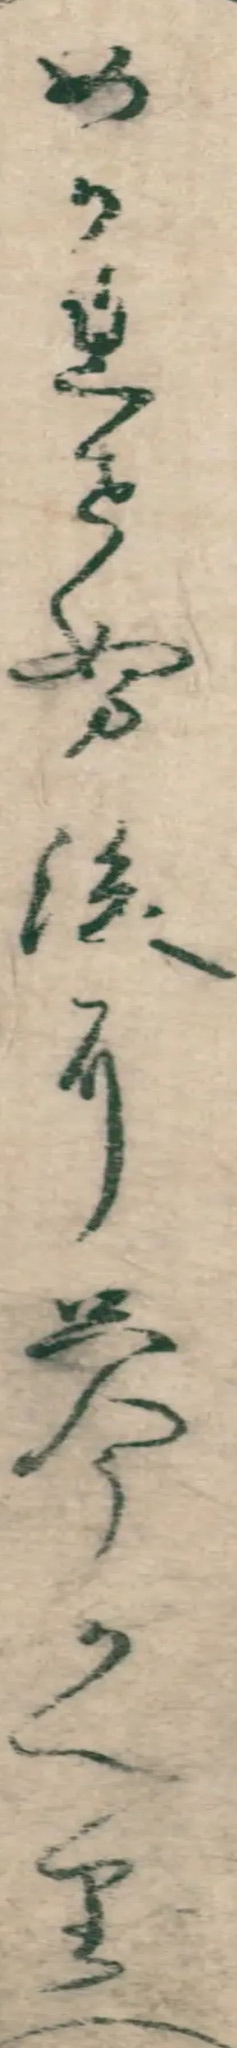めかれせぬ後に只今かへり
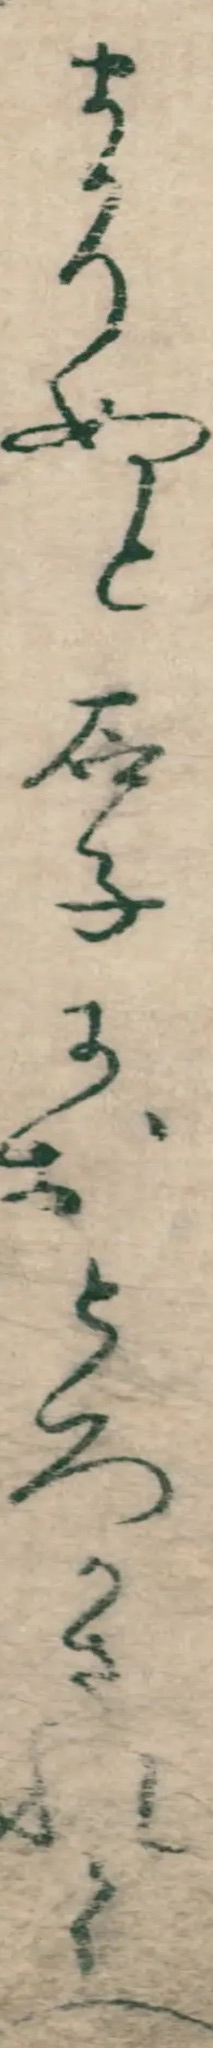まかりぬと石子におとろかされて
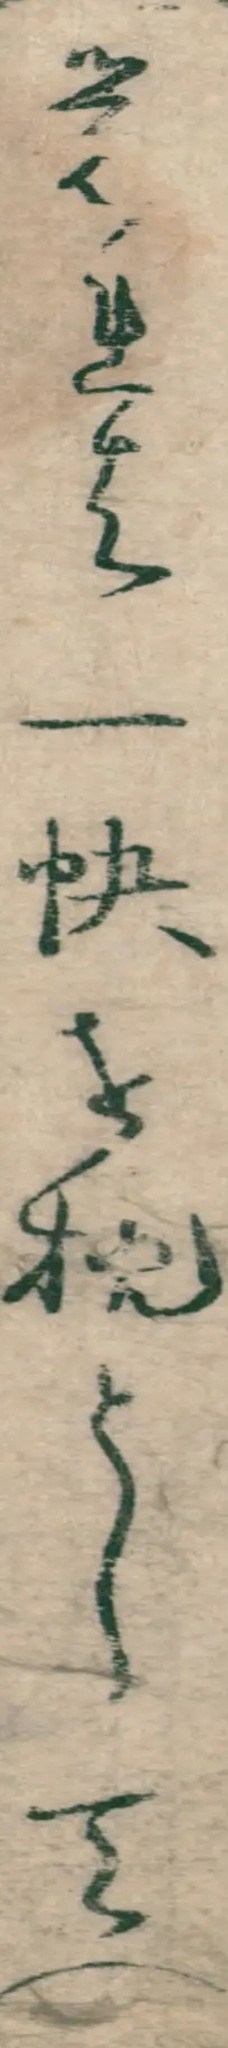覚れは一帙を枕として

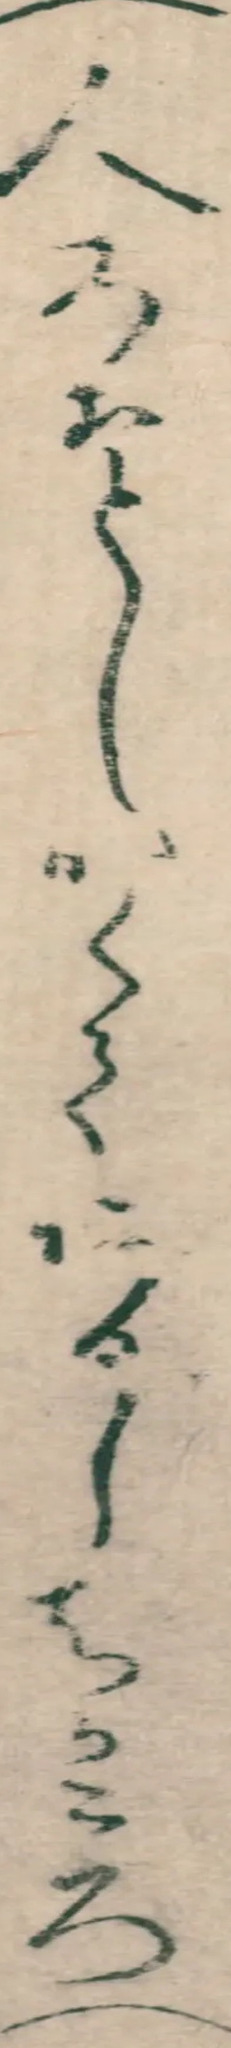人のことしかくてあるしちかころ
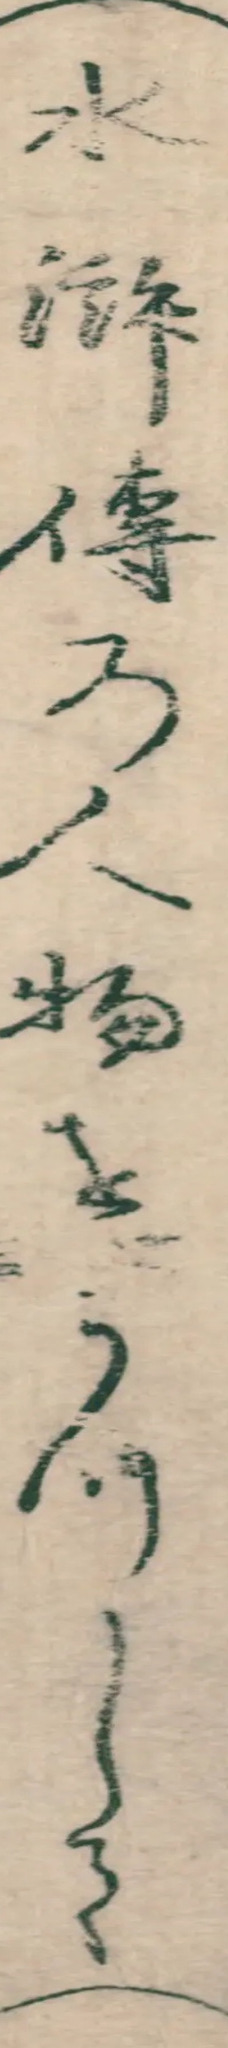水滸伝の人物をうつして
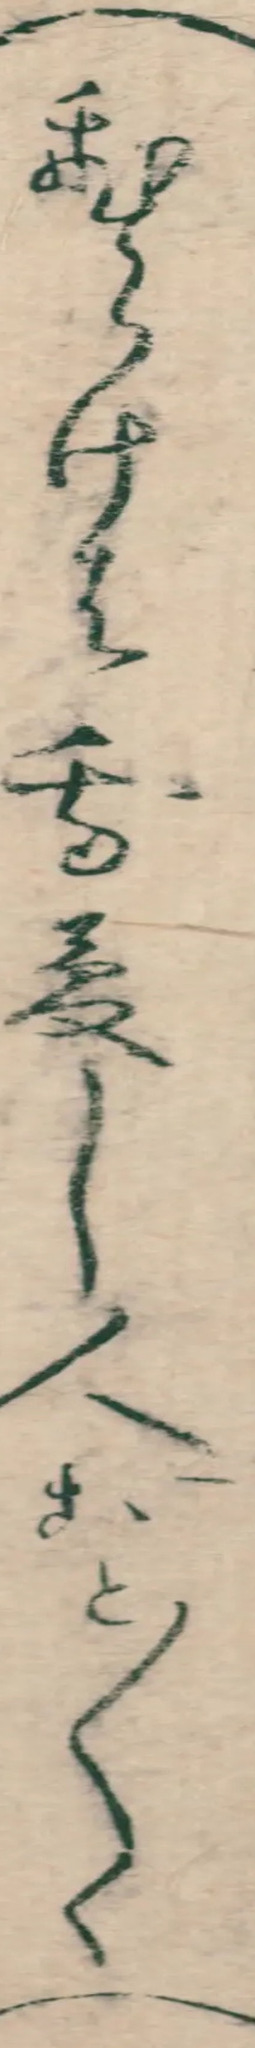ひらけは我夢し人こと〳〵く
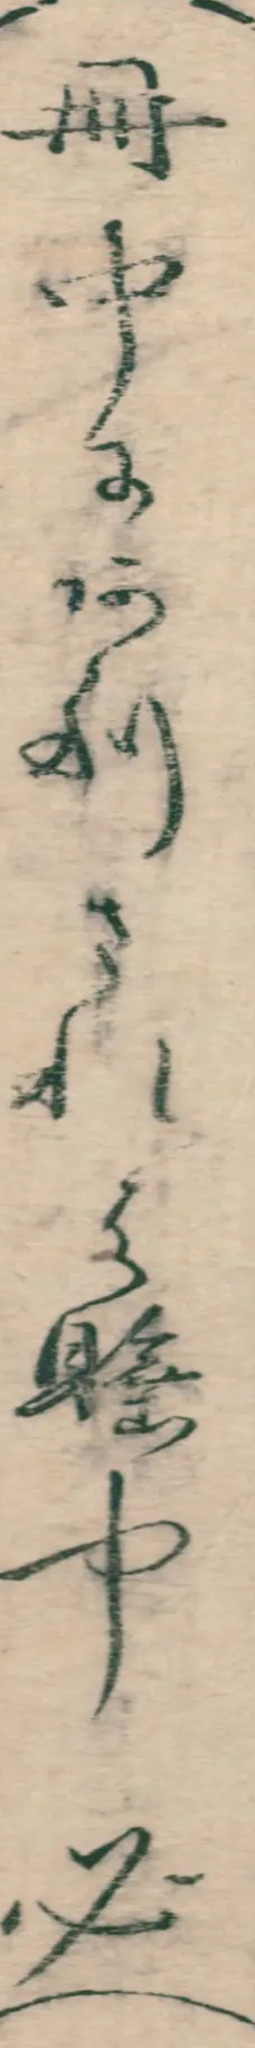冊中にありされは睡中必
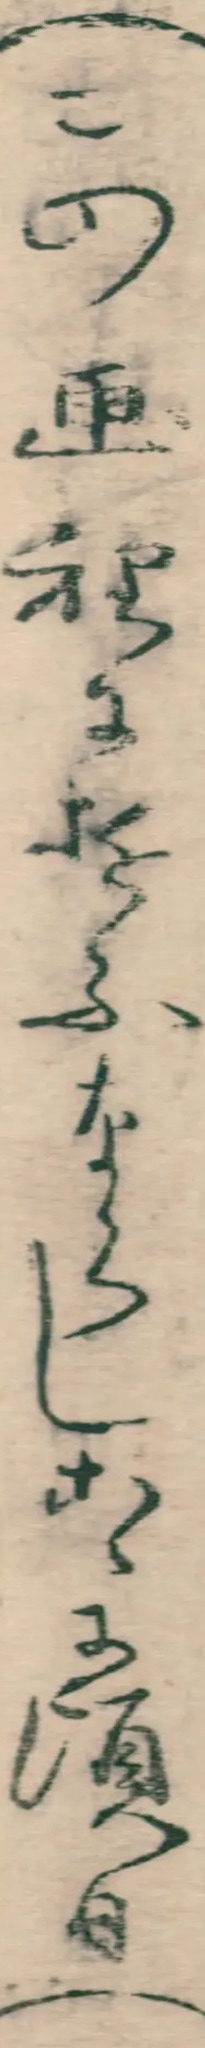この画裡に遊ふならしこゝに頃日
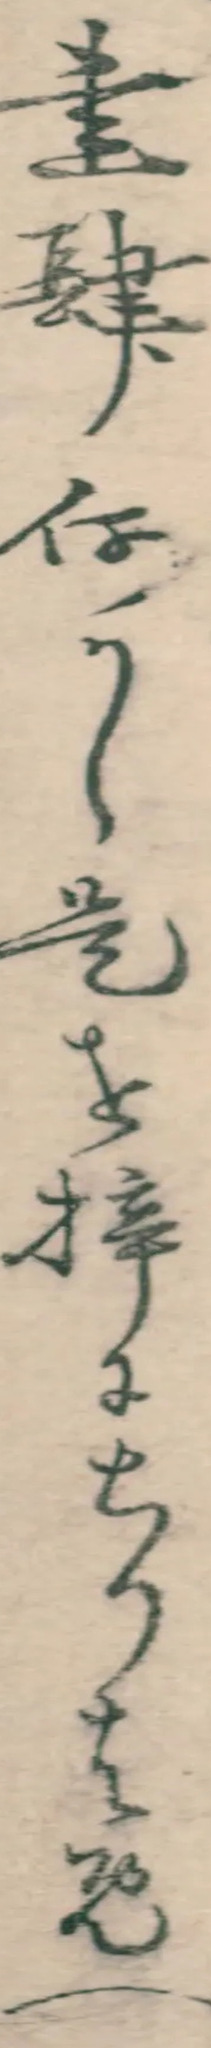書肆何かし是を梓にちりはめ
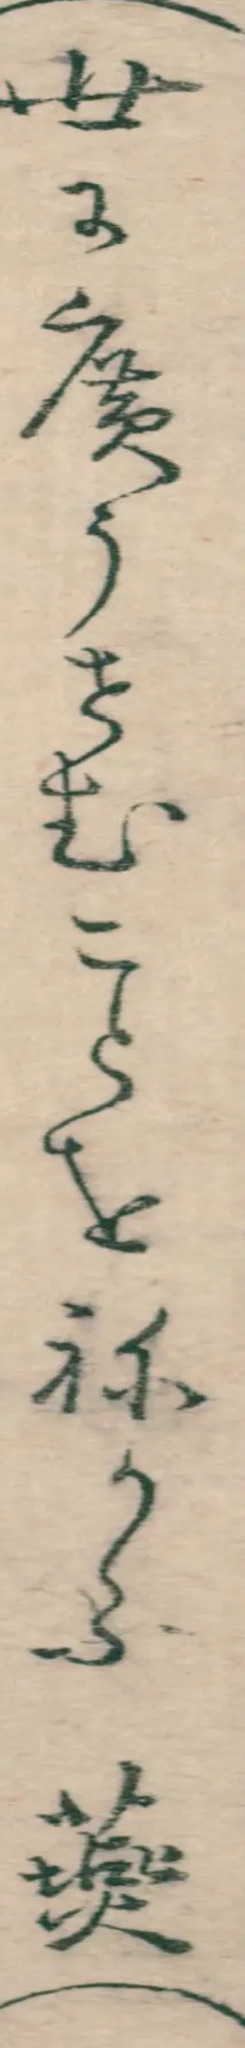世に広うせむことをねかふ燕
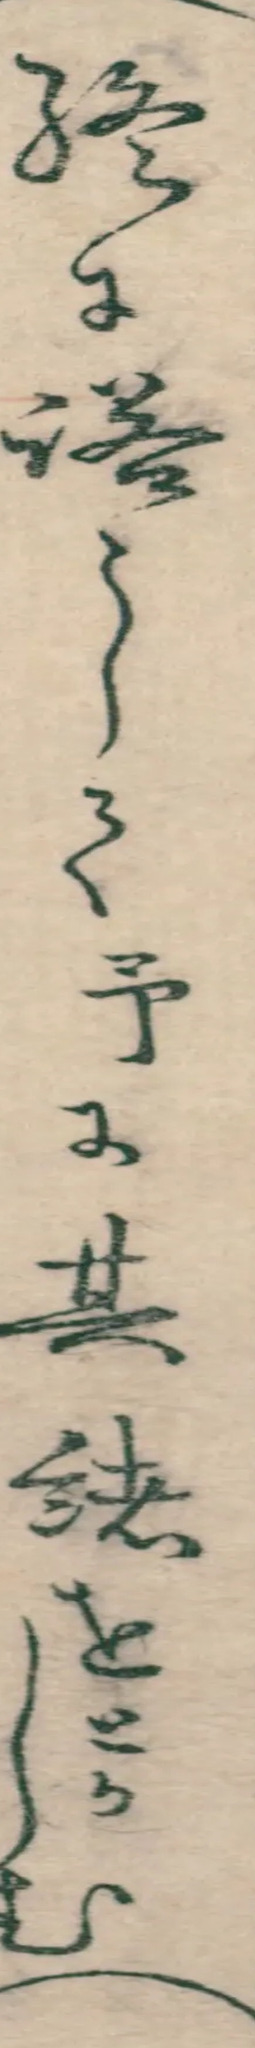終に諾して予に其緒をとかしむ
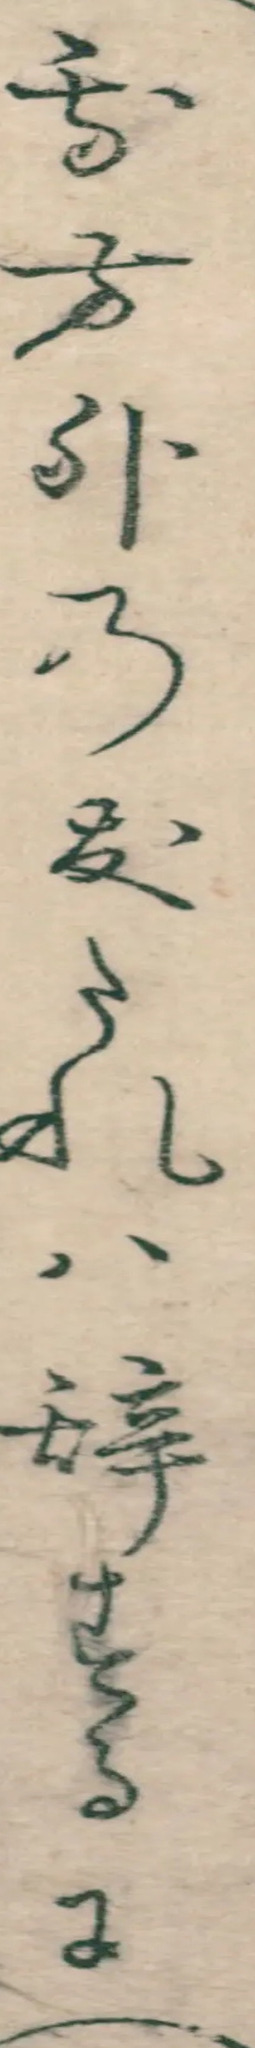我方外の友たれは辞するに
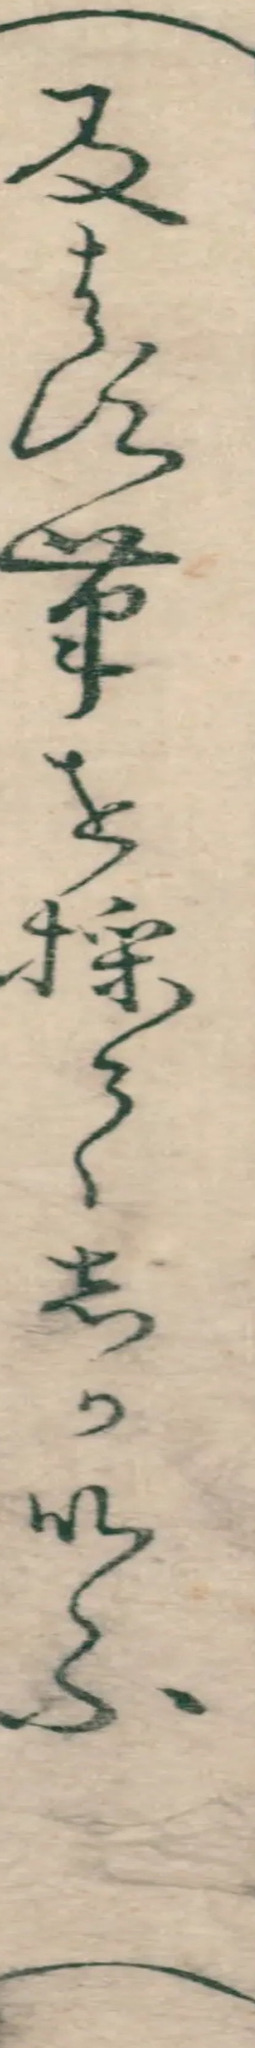及はす筆を採てしかいふ
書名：百鬼夜行 3巻拾遺3巻. [1]
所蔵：国立国会図書館 National Diet Library, JAPAN
